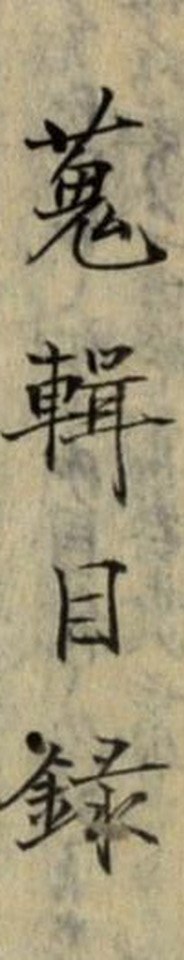蒐輯目録
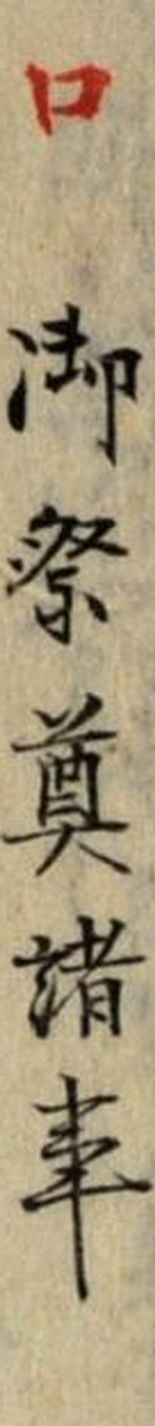ロ御祭奠諸事
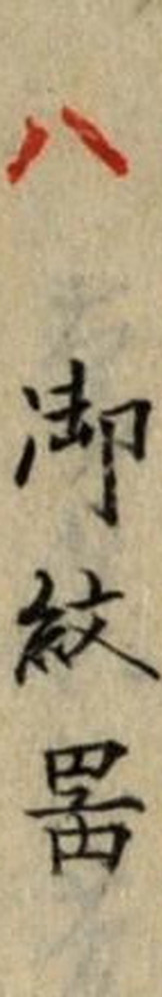ハ御紋器
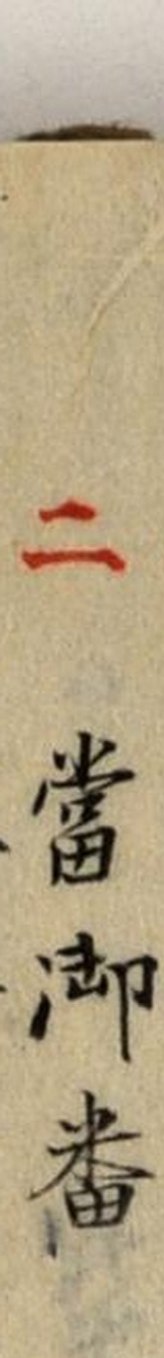ニ当御番
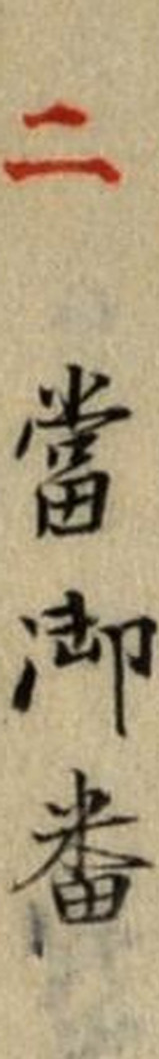ニ当御番
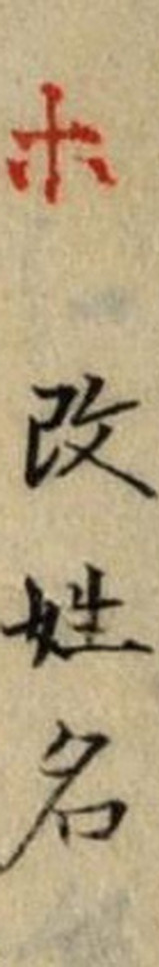ホ改姓名
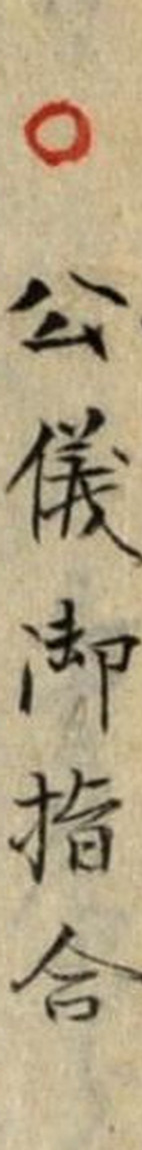○公儀御指合
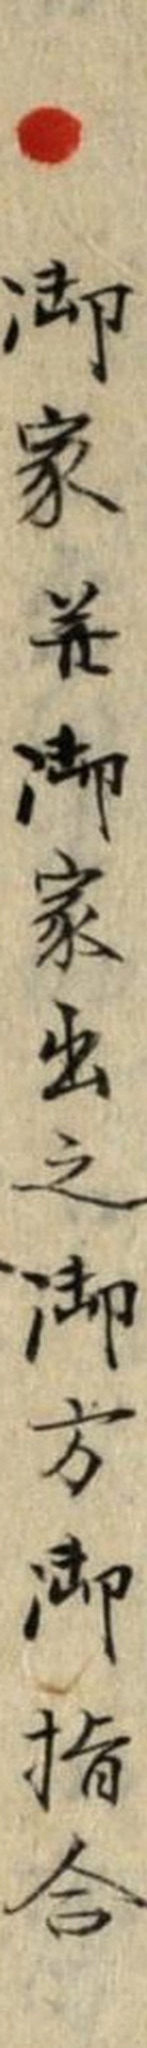●御家并御家出之御方御指合
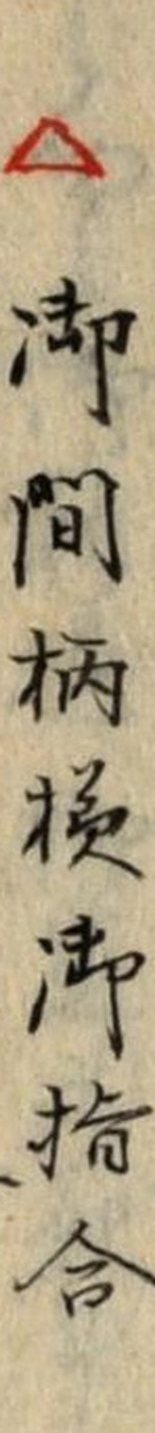△御間柄様御指合
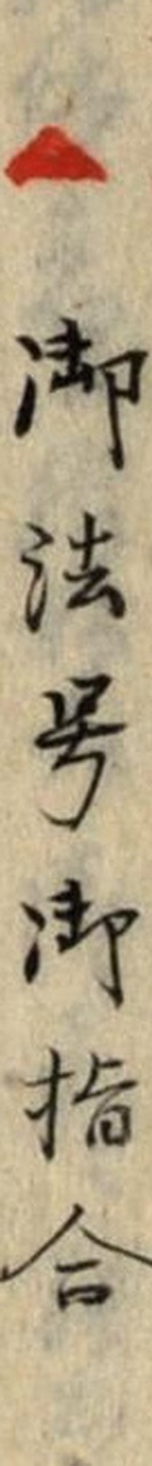▲御法号御指合
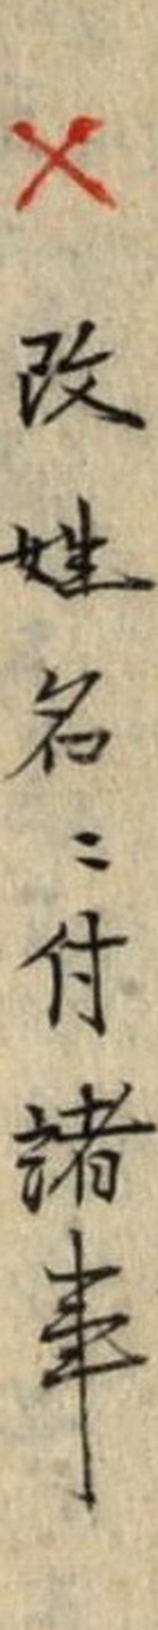×改姓名に付諸事

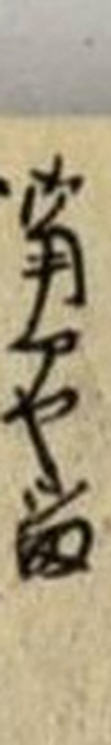御用部や留
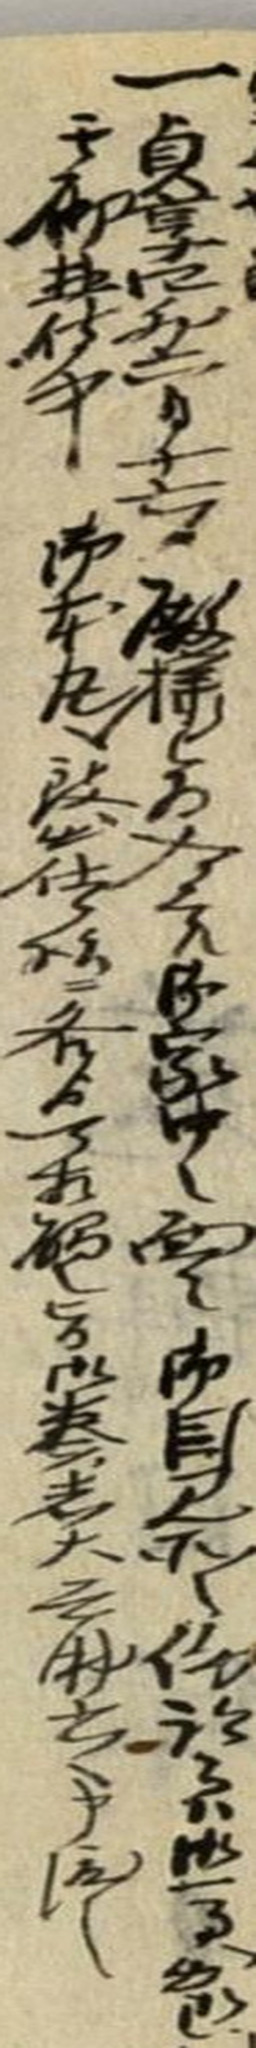其砌惣侍中御本丸へ致出仕候様に各ゟ可相触之旨御奏者大谷助六へ申渡之
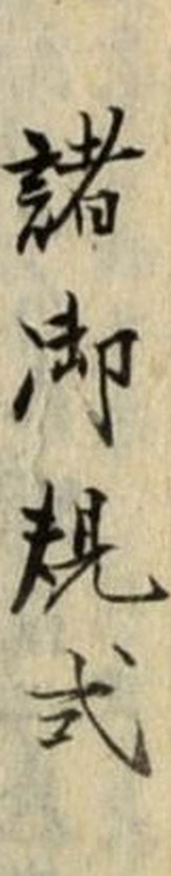諸御規式
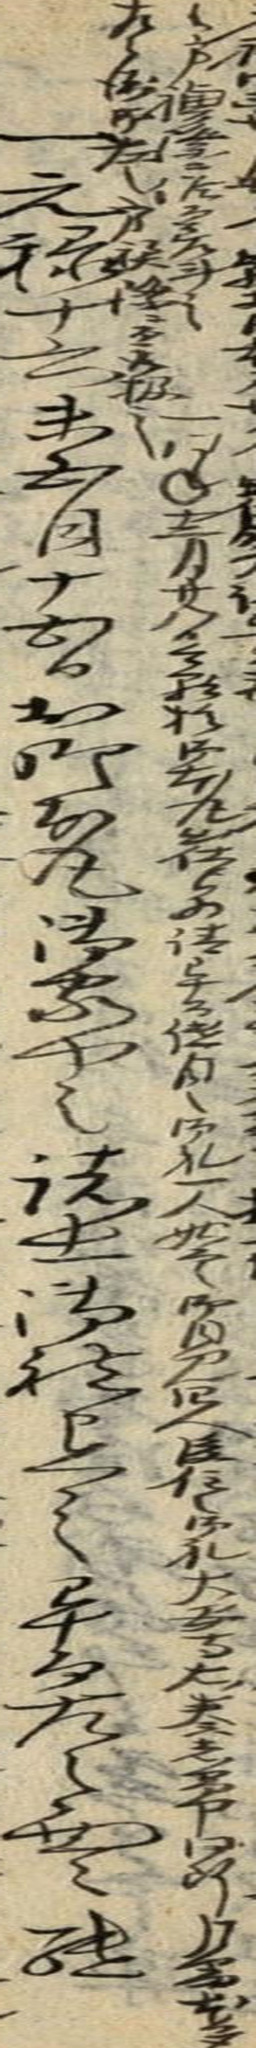一元禄十六未五月十五日於御本丸御家中之諸士御礼申上之畢而左之面々継
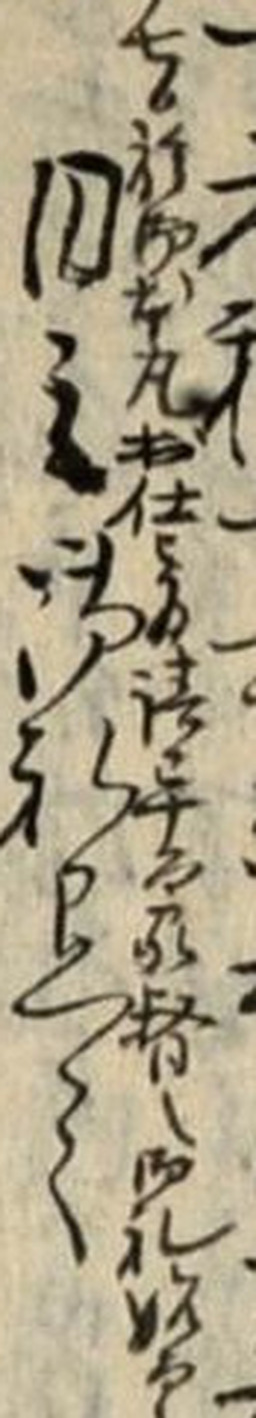目之御礼申上之
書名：蒐輯之部
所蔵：福井県文書館 Fukui Prefectural Archives
